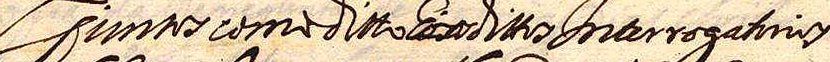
E juntos com o ditto hé os dittos Interrogatorios
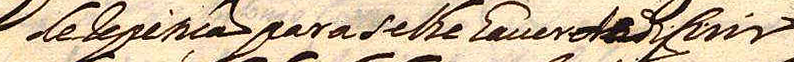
de repetiçaõ para se lhe hauer de difinir
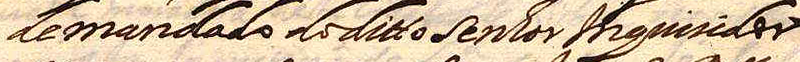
de mandado do ditto senhor Inquisidor
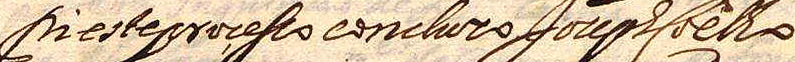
foi este proçesso concluzo Jozeph Coelho
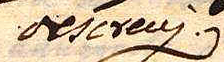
o escreuj.
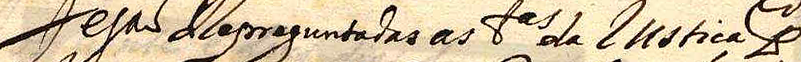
Sejaõ Repreguntadas as tas da Iustiça plos
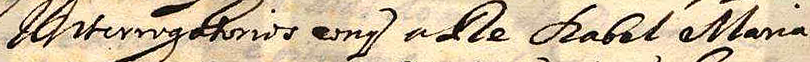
Interrogatorios con q̄ a Re Izabel Maria
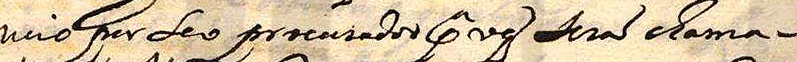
ueio per seo procurador pa o q̄ seraõ chama
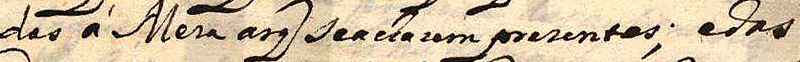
das à Meza as q̄ se acharem prezentes; e das
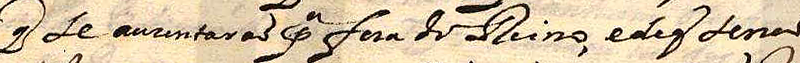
q̄ se auzentaraõ pa fora do Reino, e de q̄ se naõ
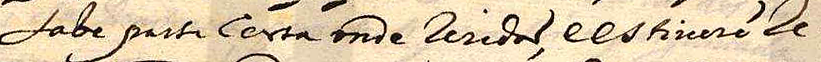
sabe parte certa onde rezidaõ, e estiuerē Re
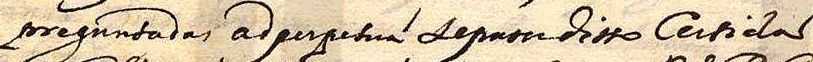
preguntadas ad perpetuū se passe disso Certidaõ
